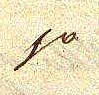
1.o
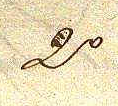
2o
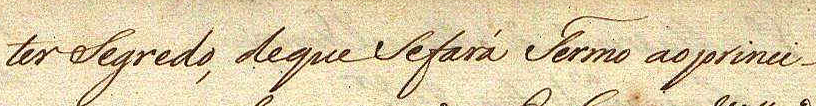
ter Segredo, de que se fará Termo ao princi
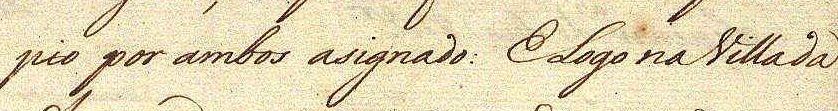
pio por ambos asignado: E Logo na Villa da
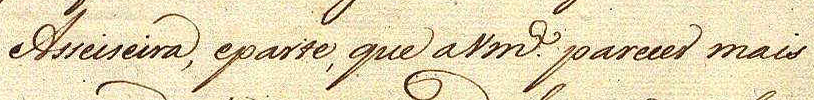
Asseiseira, e parte, que a v m.e parecer mais
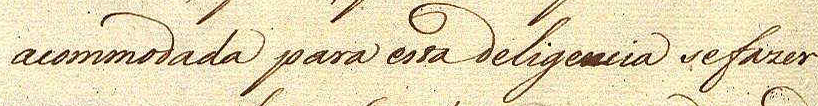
acommodada para esta deligencia se fazer
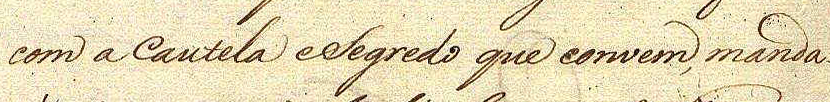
com a cautela e Segredo que convem, manda
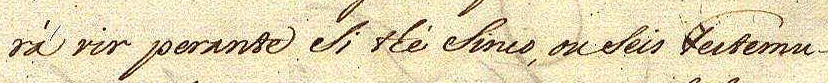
rá vir perante Si thé Sinco, ou Seis Testemu
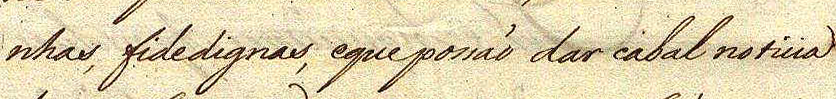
nhas, fidedignas, e que possaõ dar cabal noticia
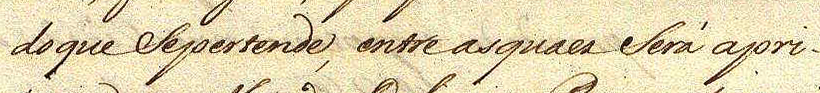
do que Se pertende, entre as quaes Será a pri
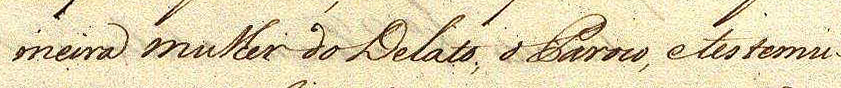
meira mulher do Delato, o Paroco, e testemu
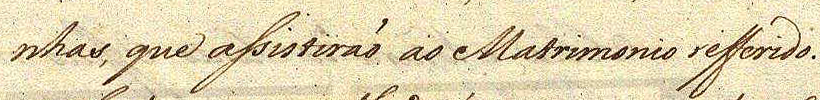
nhas, que assistiraõ ao Matrimonio refferido.
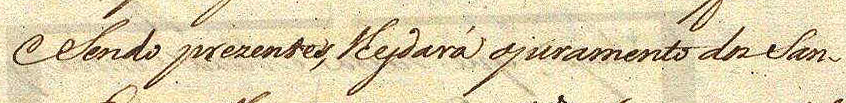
e Sendo prezentes, lhes dará o juramento dos San
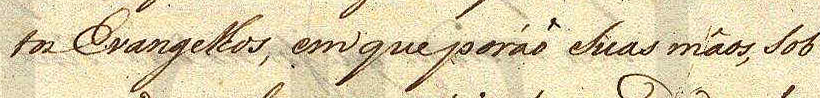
tos Evangelhos, em que poraõ Suas mãos, sob
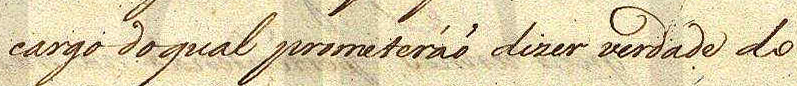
cargo do qual prometeraõ dizer verdade do
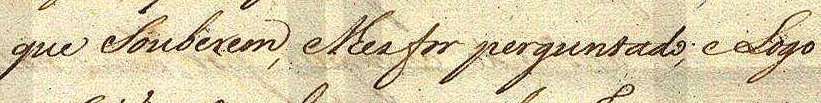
que Souberem, e lhes for perguntado; e Logo
